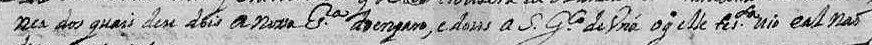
nca dos quais deu dois a nossa S.ra do enparo, e dous a S. G.lo de Vnā o q̄ elle testa uio e al naõ
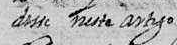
disse neste artigo
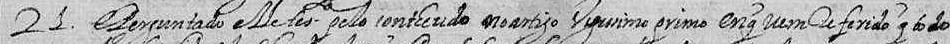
21. E Perguntado elle testa pelo contheudo no artigo Vigessimo primo en q̄ uem Referido q̄ todo
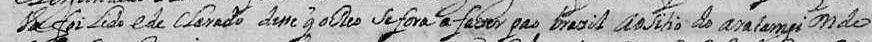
lhe foi lido e declarado disse q̄ o Reo se fora a fazer pao brazil ao sitio do aratamgi onde
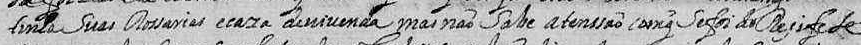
tinha suas Rossarias e caza de uiuenda mas não Sabe a tenssaõ com q̄ Se foi do Recife Se
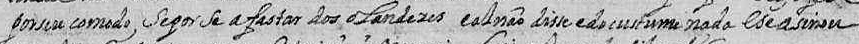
por seu comodo, Se por se afastar dos olandezes e al não disse e do custume nada e se asinou
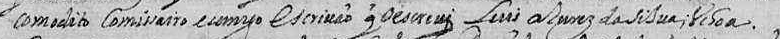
com o dito Comissairo e comigo Escriuaõ q̄ o escreuj Luis alurez da Silua Vchoa.
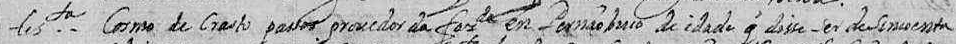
tes.ta Cosmo de Crasto passos prouedor da fazda en Pernãobuco de idade q̄ disse ser de sincoenta
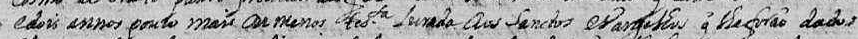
e dois annos pouco mais ou menos tes.ta Iurada aos Sanctos eVangelhos q̄ lhe foraõ dados
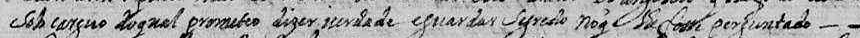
Sob carguo do qual prometeo dizer uerdade e guardar segredo no q̄ lhe fosse perguntado
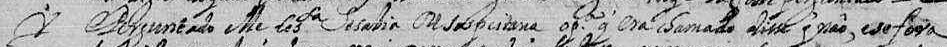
item E Perguntado elle testa Se sabia ou sospeitaua o p.a q̄ era chamado disse q̄ naõ, e se fora
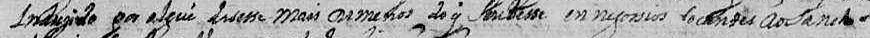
Induzido por alguē disesse mais ou menos do q̄ soubesse en negossios tocantes ao sancto
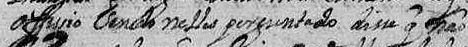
offissio Sendo nelles perguntado disse q̄ naõ
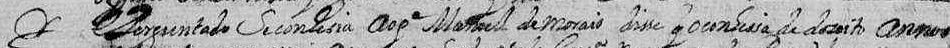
item E Perguntado Se conhesia ao pe Manoel de morais disse q̄ o conhesia de dezoito annos
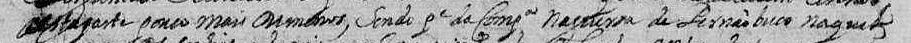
a esta parte pouco mais ou menos, Sendo pe da Compa na guerra de Pernaõbuco no qual
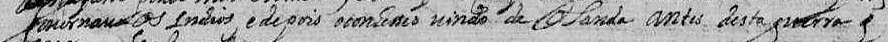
gouernauā os Indios e depois o conhesseo uindo de Olanda antes desta guerra q̄
